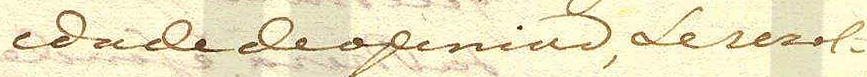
edade de openiaõ, se rezol
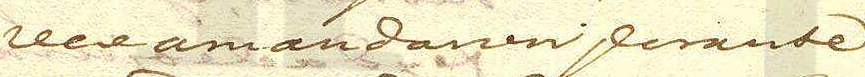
veo a mandar vir perante
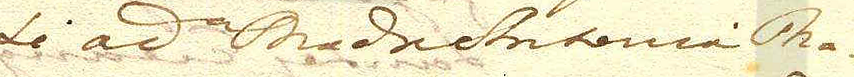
si a d.a Madre Antonia Ma
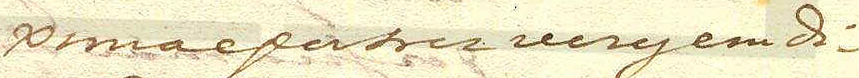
xima e por trez vezes em di
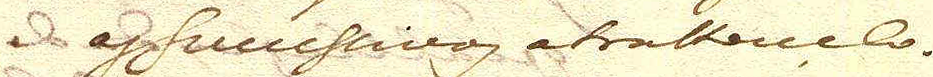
as successivos a tractou, e Co
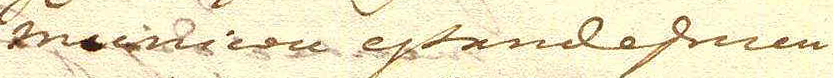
municou estando prezen
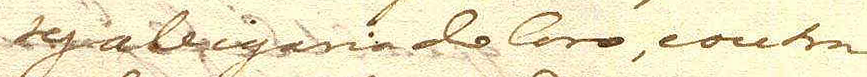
tes a Vigaria do Coro, e outra
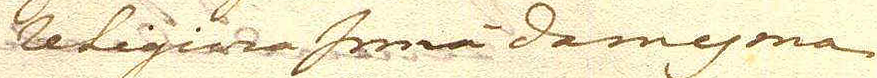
Religioza Jrmã da mesma
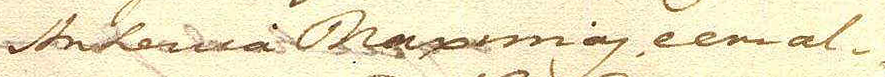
Antonia Maximas, e em al
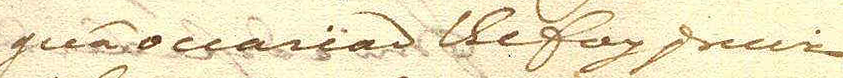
guā occaziaõ lhe foy precizo
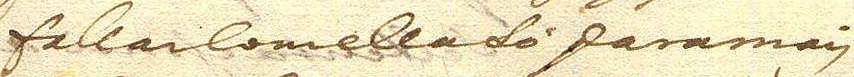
fallar com ella só para mais
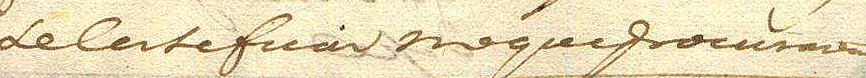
se certificar no que procurava
